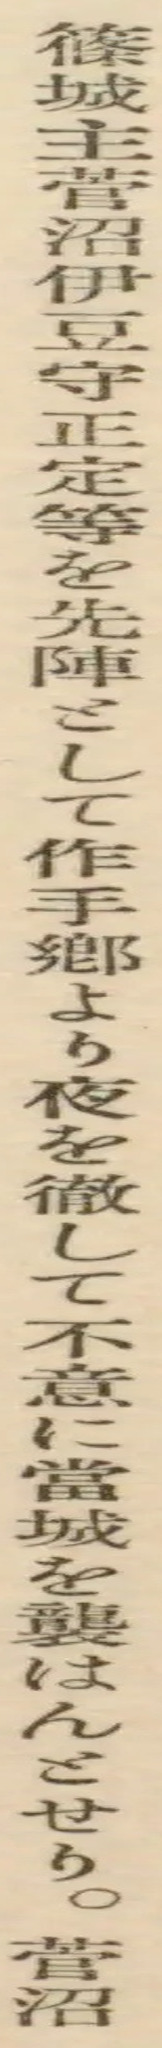篠城主菅沼伊豆守正定等を先陣として作手郷より夜を徹して不意に当城を襲はんとせり。菅沼
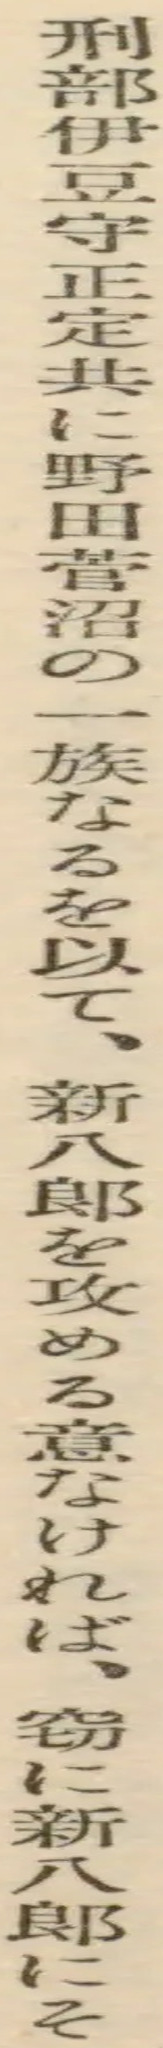刑部伊豆守正定共に野田菅沼の一族なるを以て、新八郎を攻める意なければ、窃に新八郎にそ
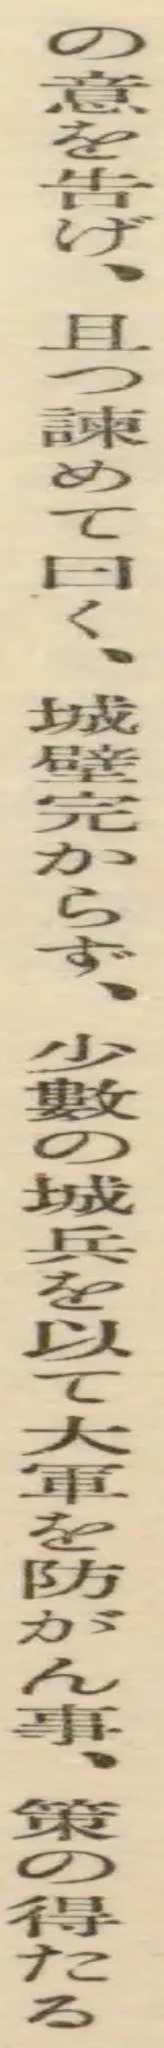の意を告げ、且つ諌めて曰く、城壁完からず、少数の城兵を以て大軍を防がん事、策の得たる
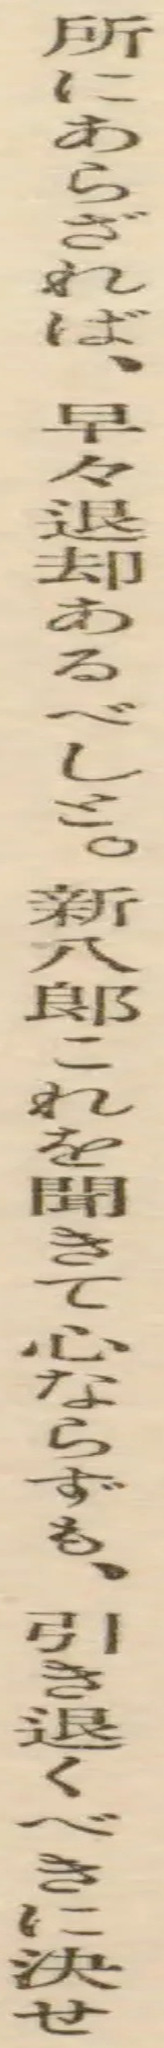所にあらざれば、早々退却あるべしと。新八郎これを聞きて心ならずも、引き退くべきに決せ
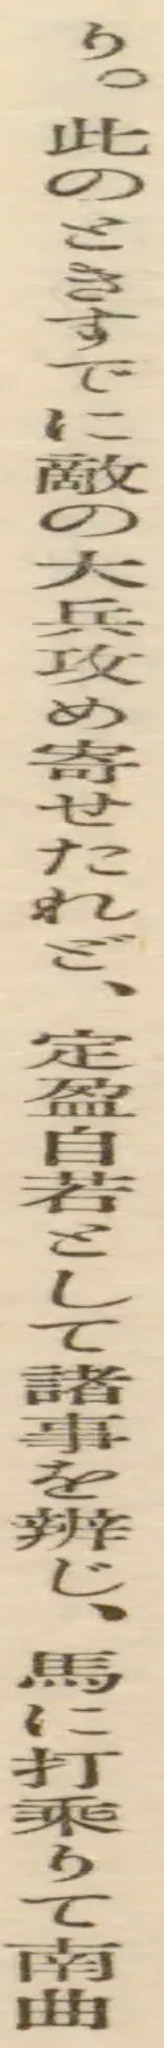り。此のときすでに敵の大兵攻め寄せたれど、定盈自若として諸事を弁じ、馬に打乗りて南曲
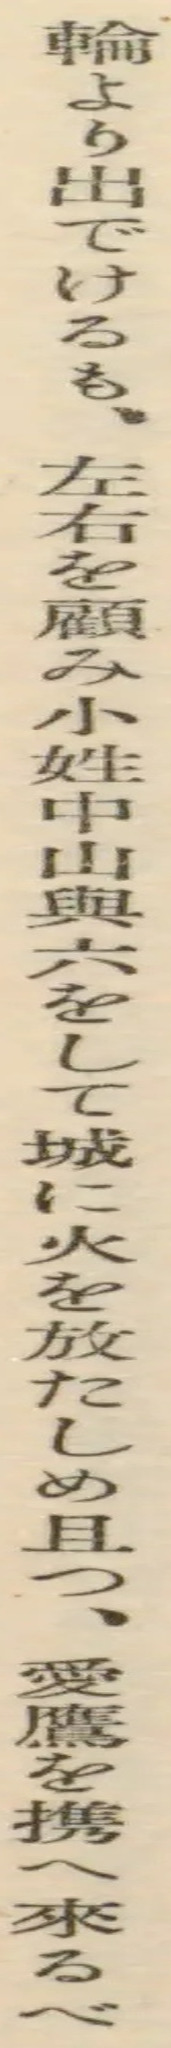輪より出でけるも、左右を顧み小姓中山与六をして城に火を放たしめ且つ、愛鷹を携へ来るべ
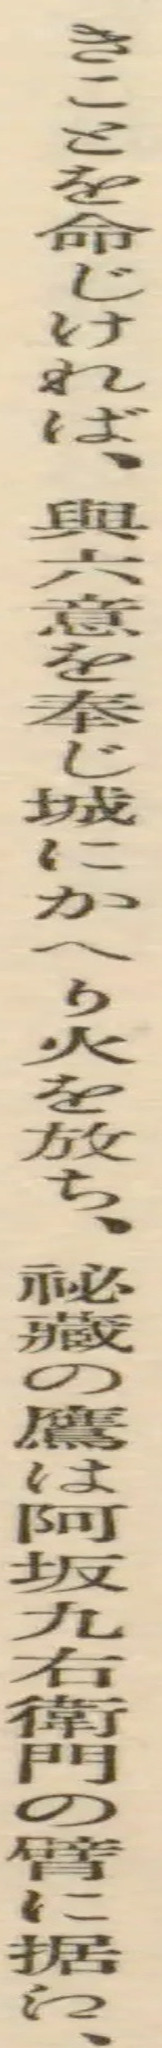きことを命じければ、与六意を奉じ城にかへり火を放ち、秘蔵の鷹は阿坂九右衛門の臂に据え、
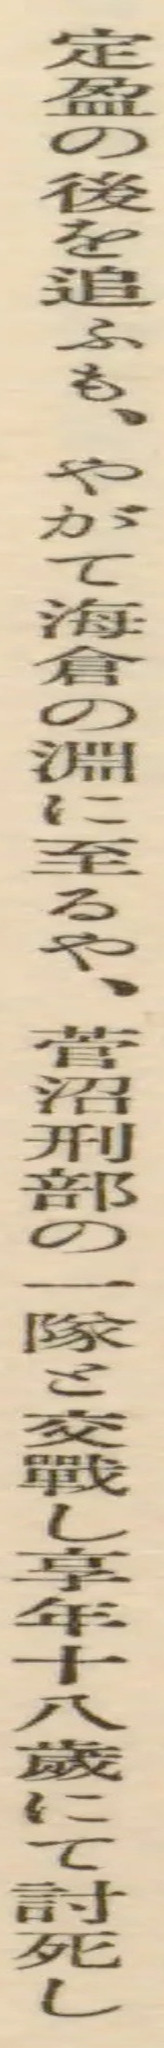定盈の後を追ふも、やがて海倉の淵に至るや、菅沼刑部の一隊と交戦し享年十八歳にて討死し
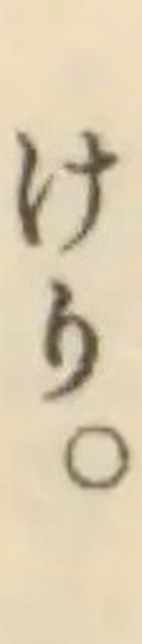けり。
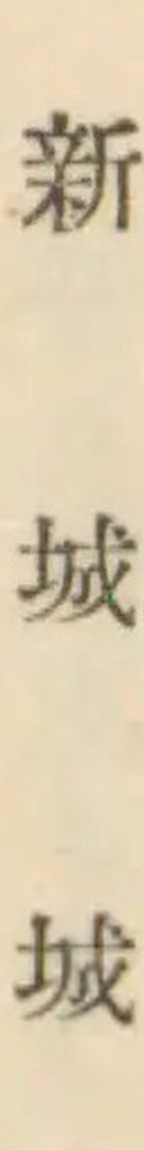新城城
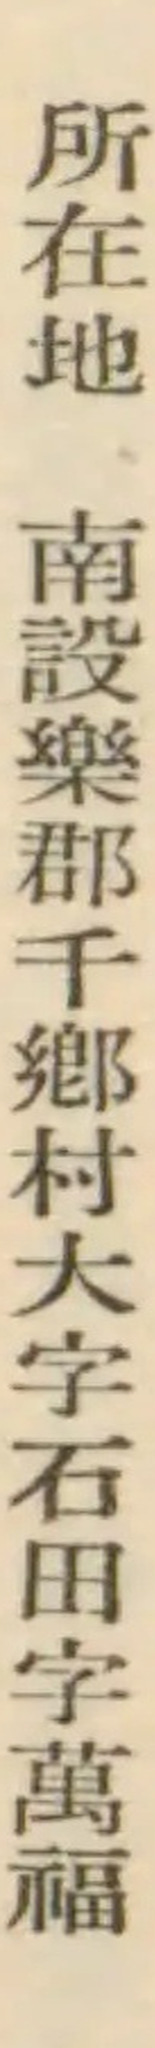所在地南設楽郡千郷村大字石田字万福
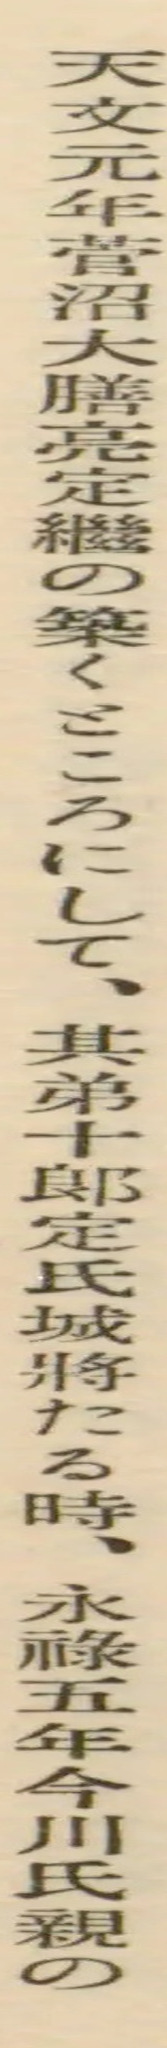天文元年菅沼大膳亮定継の築くところにして、其弟十郎定氏城将たる時、永禄五年今川氏親の

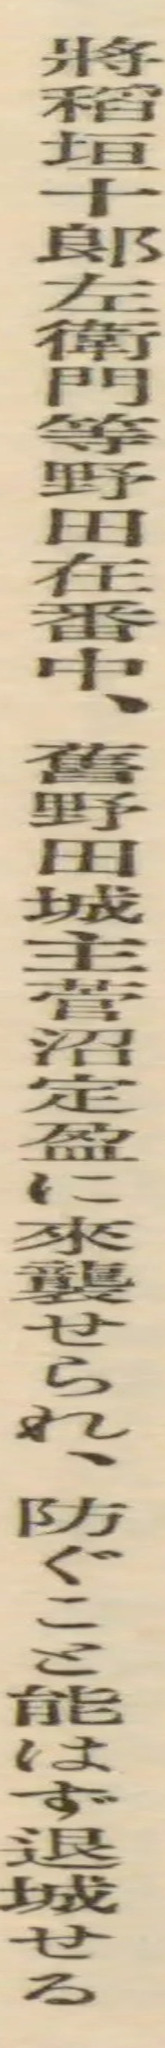将稲垣十郎左衛門等野田在番中、旧野田城主菅沼定盈に来襲せられ、防ぐこと能はず退城せる
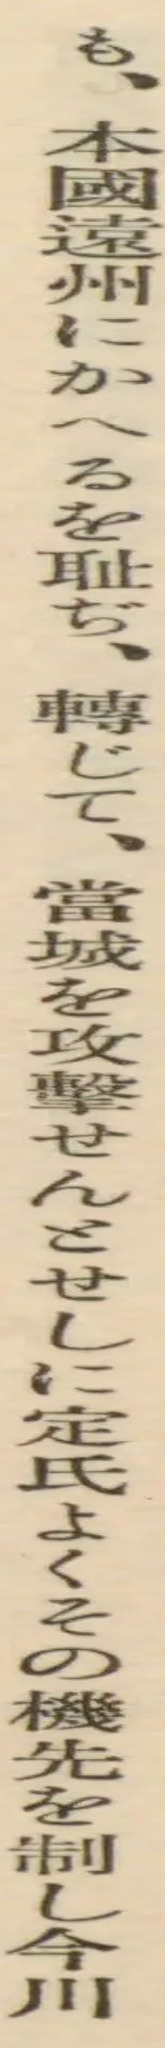も、本国遠州にかへるを恥じ、転じて、当城を攻撃せんとせしに定氏よくその機先を制し今川
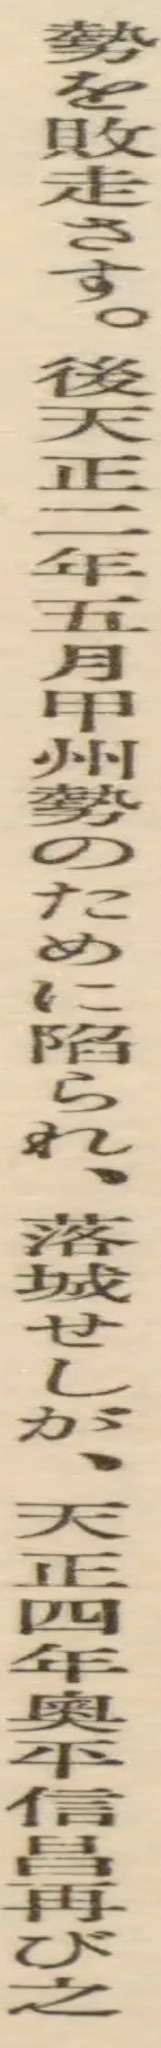勢を敗走さす。後天正二年五月甲州勢のために陥られ、落城せしが、天正四年奥平信昌再び之
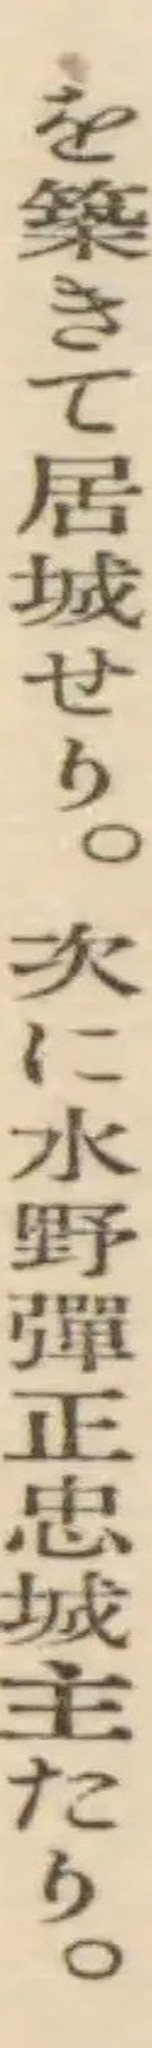を築きて居城せり。次に水野弾正忠城主たり。
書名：東三河之古城
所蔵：国立国会図書館 National Diet Library, JAPAN
